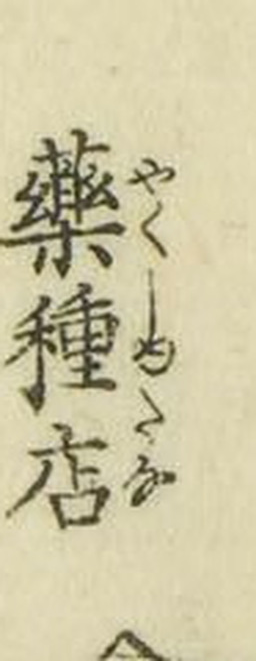薬種店
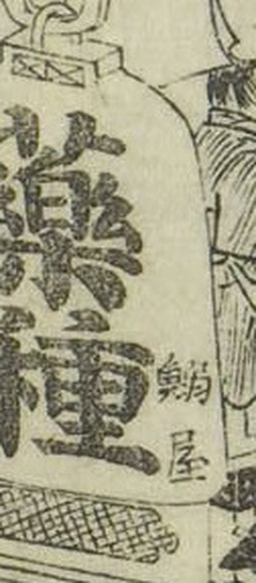薬種店

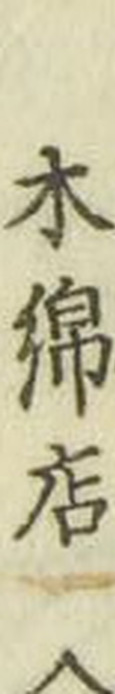木綿店

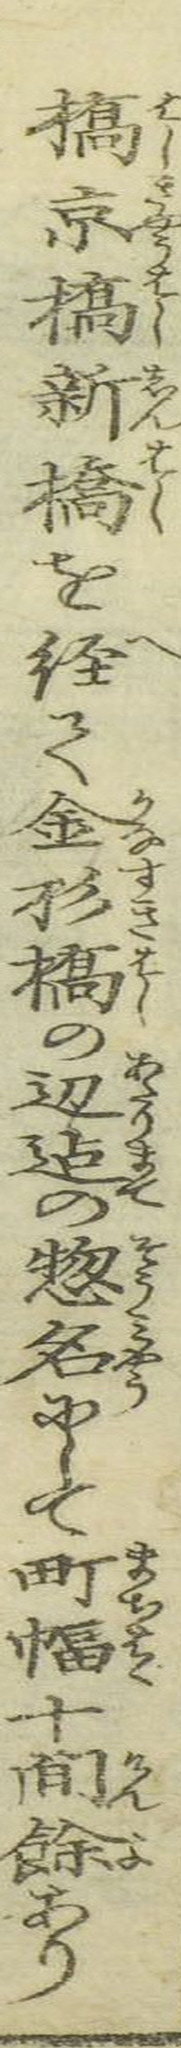橋京橋新橋を経て金杉橋の辺迄の総名にして町幅十間余あり
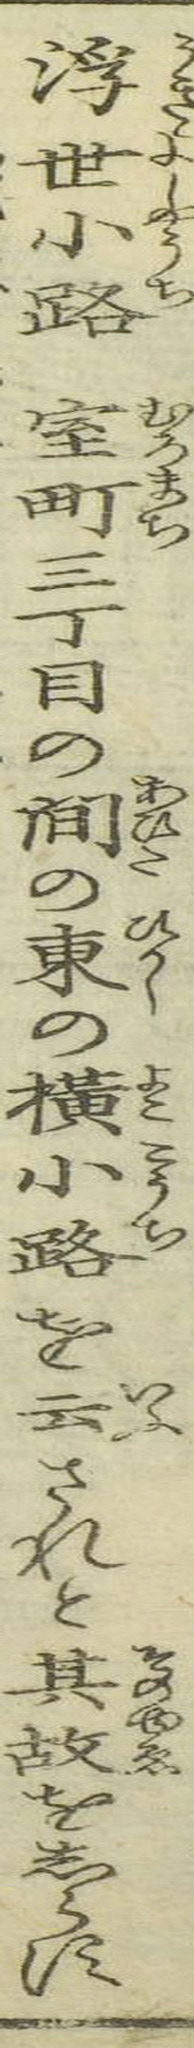浮世小路室町三丁目の間の東の横小路を云されと其故をしらす
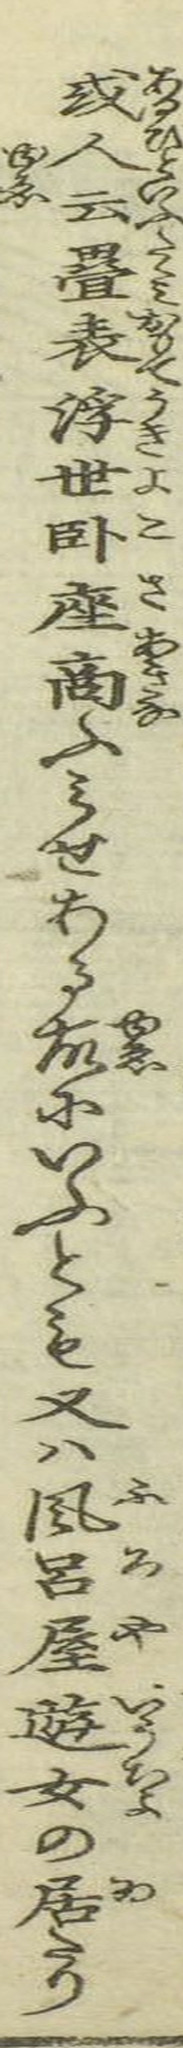或人云畳表浮世臥座商ふみせある故にいふとも又は風呂屋遊女の居たり
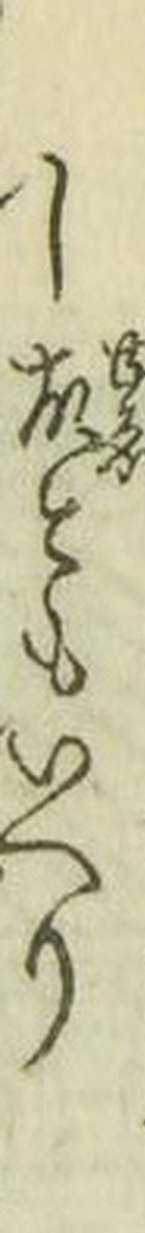し故ともいへり
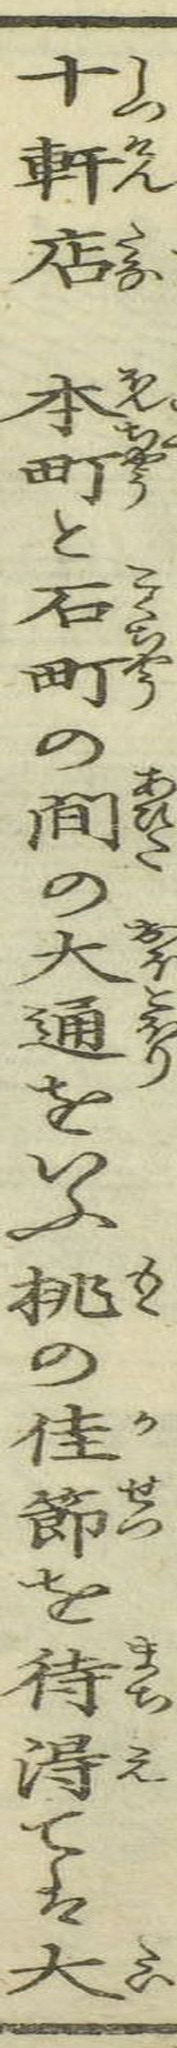十軒店本町と石町の間の大通をいふ桃の佳節を待得ては大
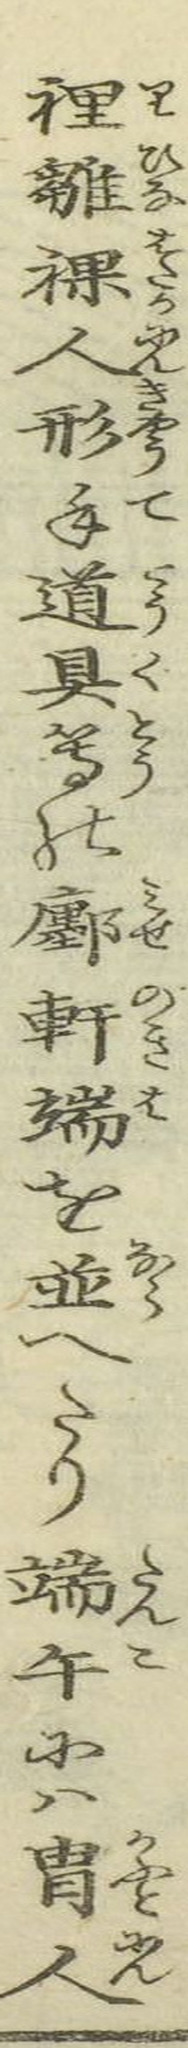裡雛裸人形手道具等の鄽軒端を並へたり端午には冑人
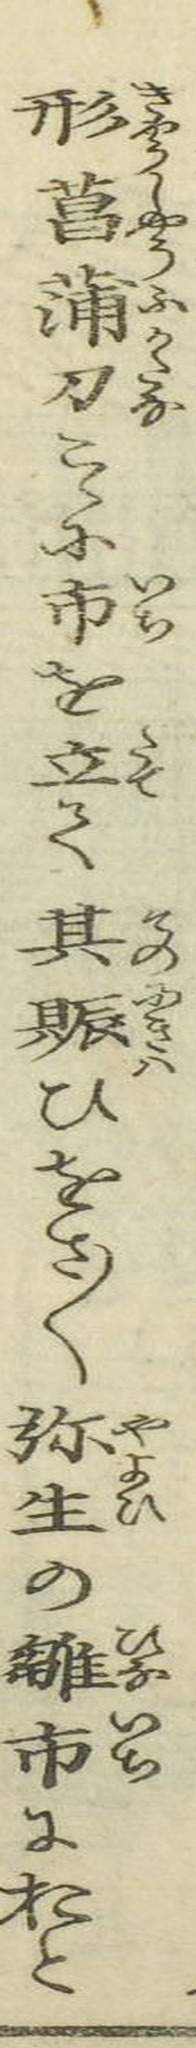形菖蒲刀こゝに市を立て其賑ひをさ〳〵弥生の雛市におと
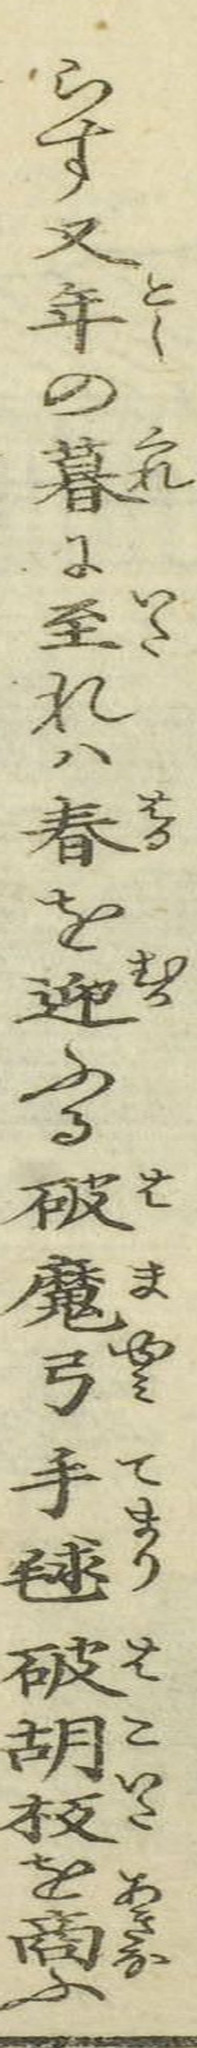らす又年の暮れに至れは春を迎ふる破魔弓手毬破胡板を商ふ
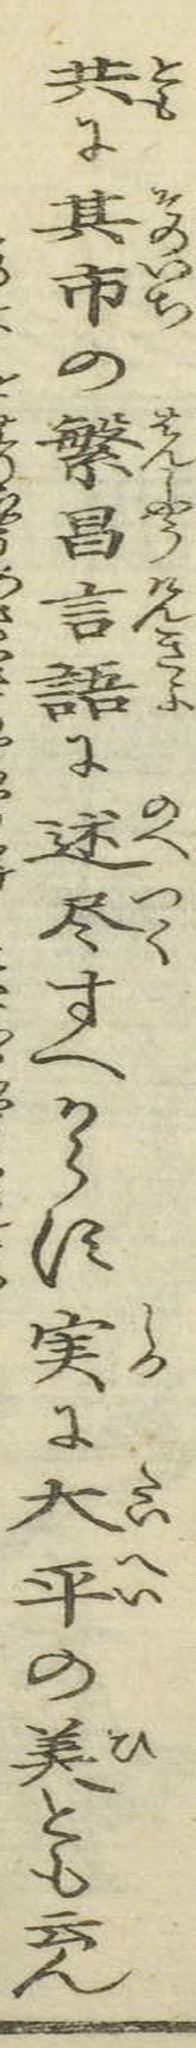共に其市の繁昌言語に述尽すへからす実に大平の美とも云ん
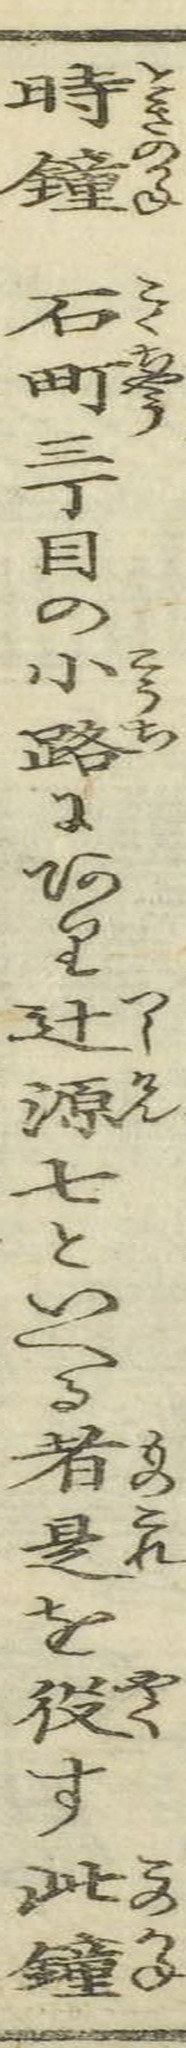時鐘石町三丁目の小路にあり辻源七といへる者是を役す此鐘
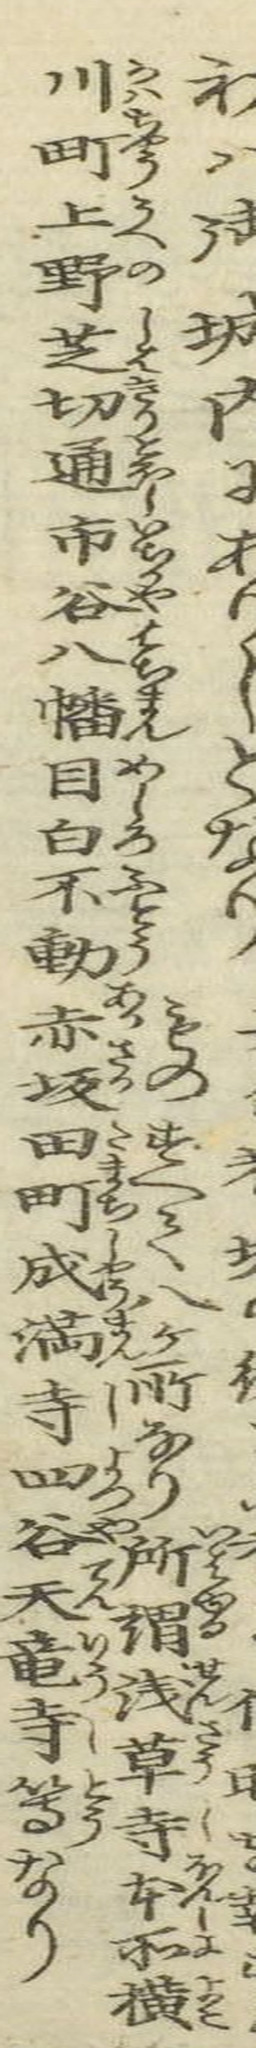川町上野芝切通市谷八幡目白不動赤坂田町成満寺四谷天竜寺等なり
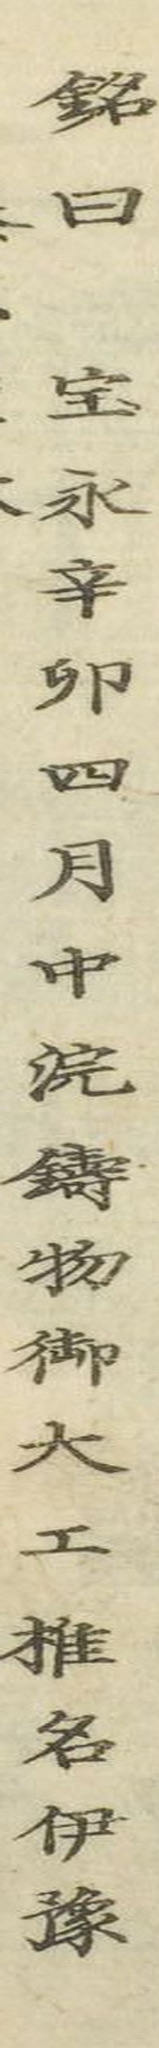銘曰宝永辛卯四月中浣鋳物御大工椎名伊豫
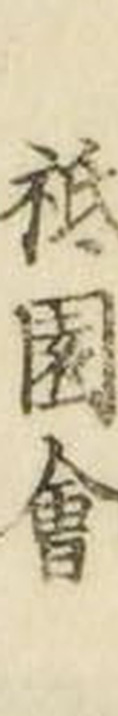祇園会
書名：江戸名所図会 20巻 巻之1
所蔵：東京学芸大学教育コンテンツアーカイブ
